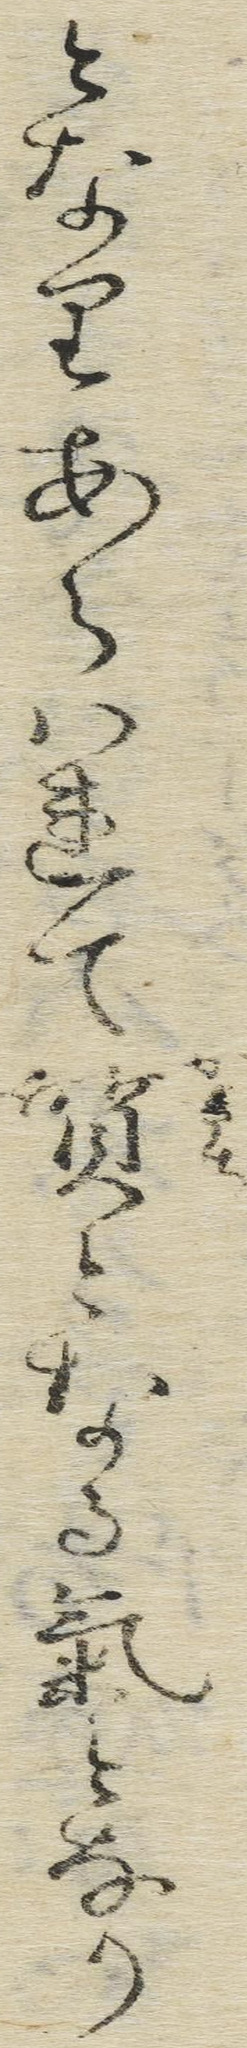となりあらはれて質となる気となり
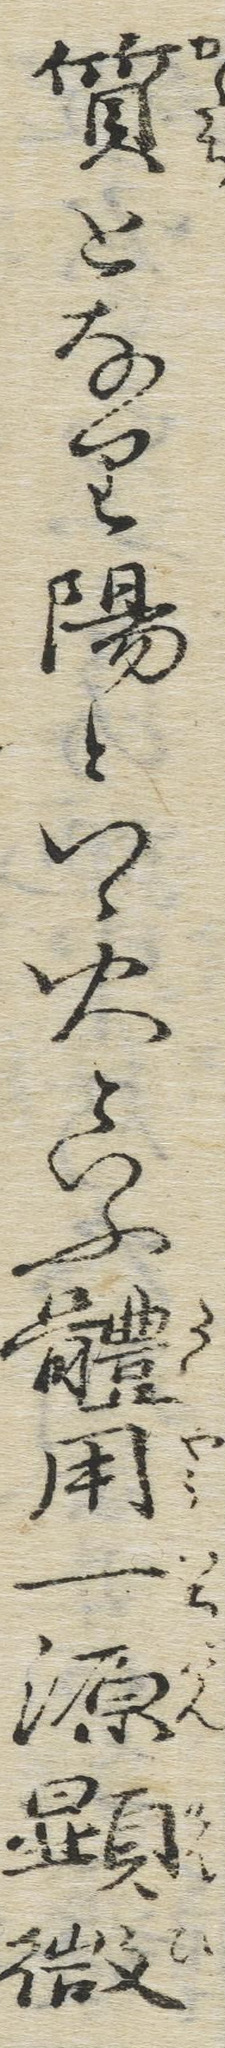質となり陽といゝ火といふ体用一源顕微
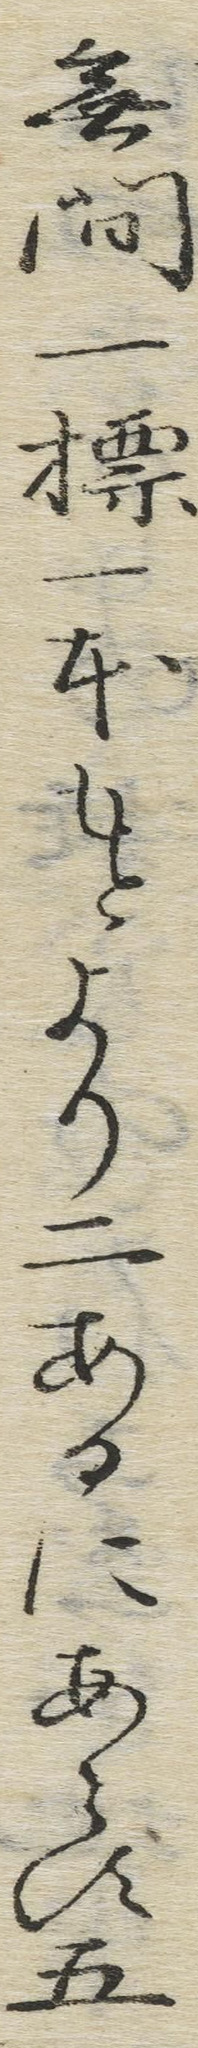無間一標一本もとより二あるにあらす五
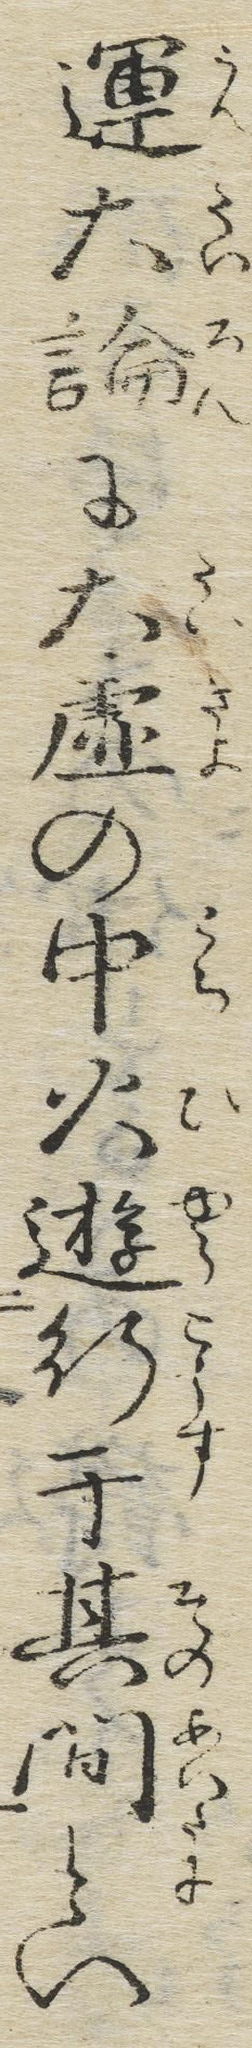運大論に太虚の中火遊行于其間とい
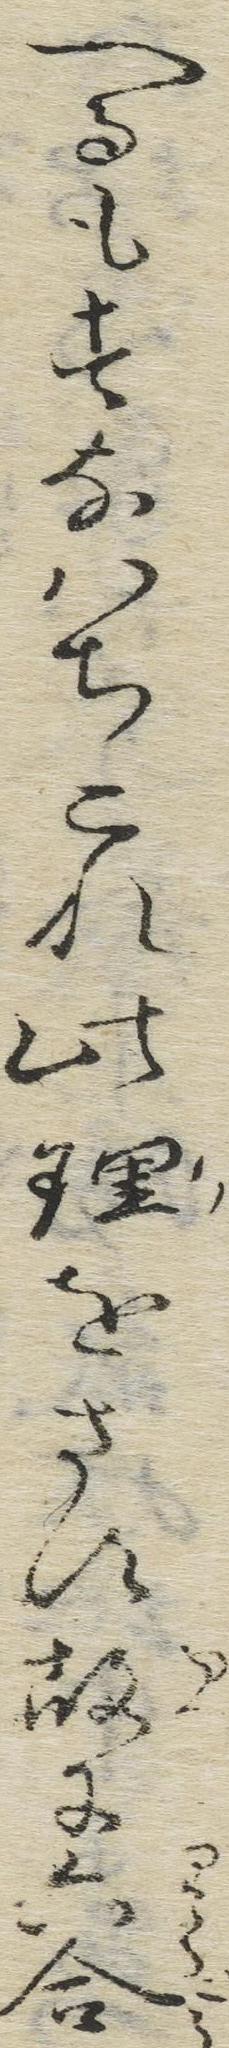へるもすなはちこれ此理をさす故に六合
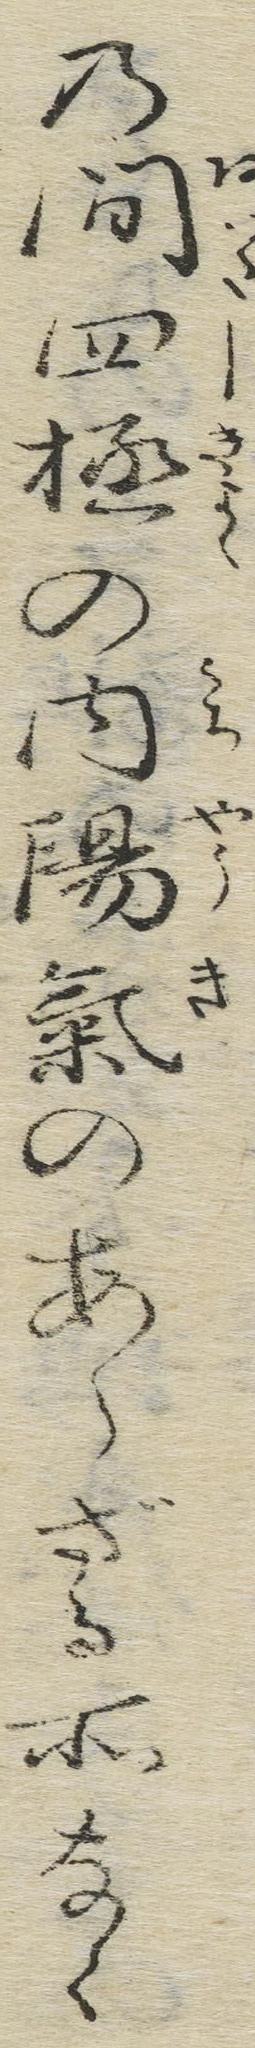乃間四極の内陽気のあらざる所なく
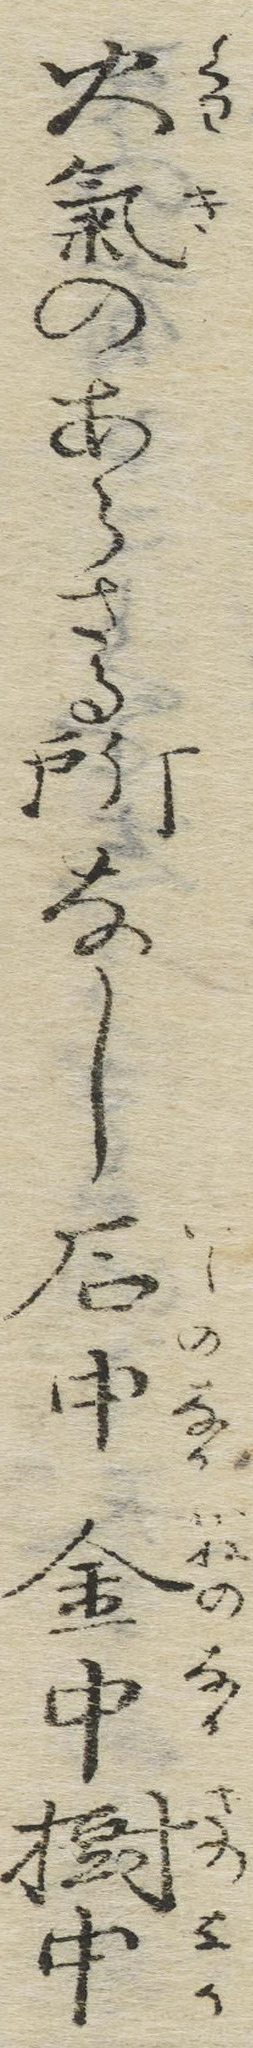火気のあらさる所なし后中金中樹中
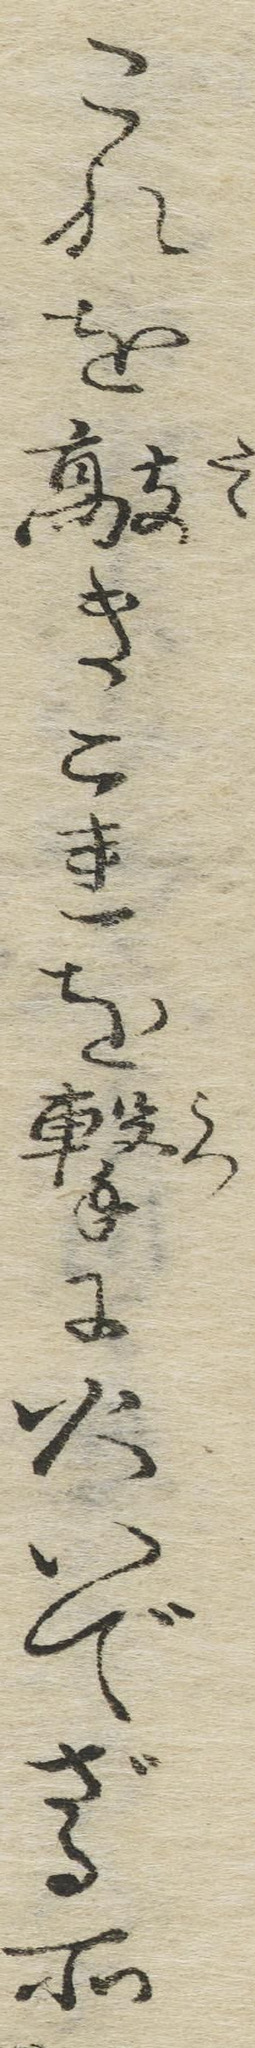これを敲くこれを撃に火いでざる所
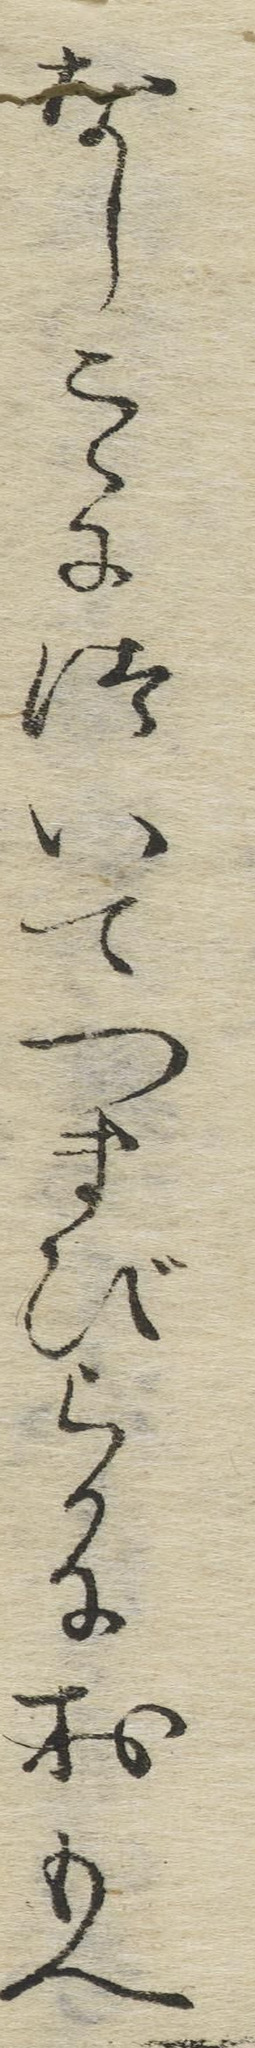なしこゝについてつまびらかにおもへ

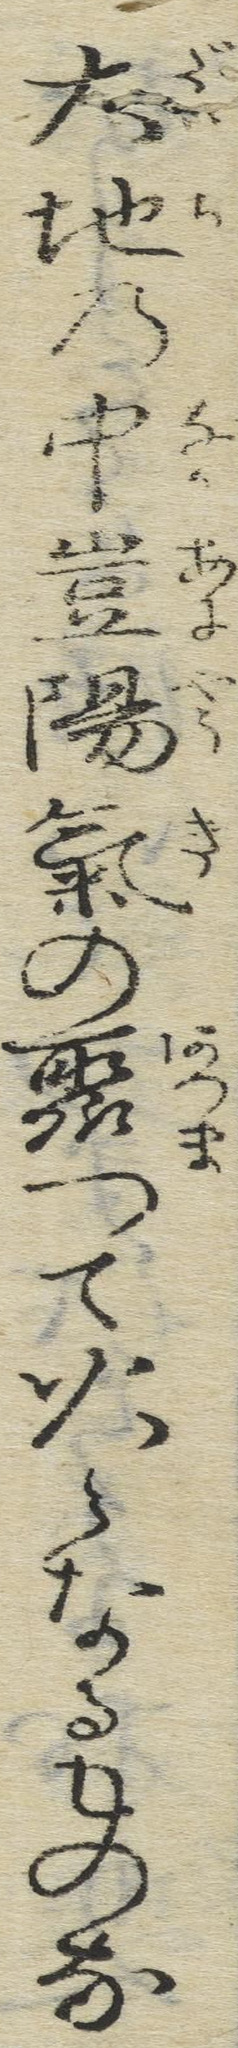大地の中豈陽気の聚つて火となるものな
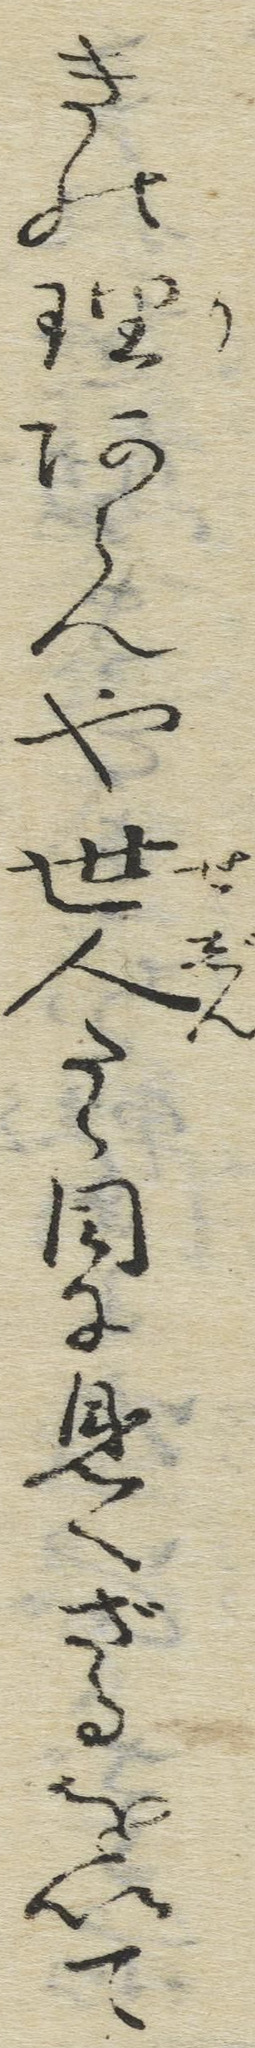きの理あらんや世人たゝ目に見へざるを以て
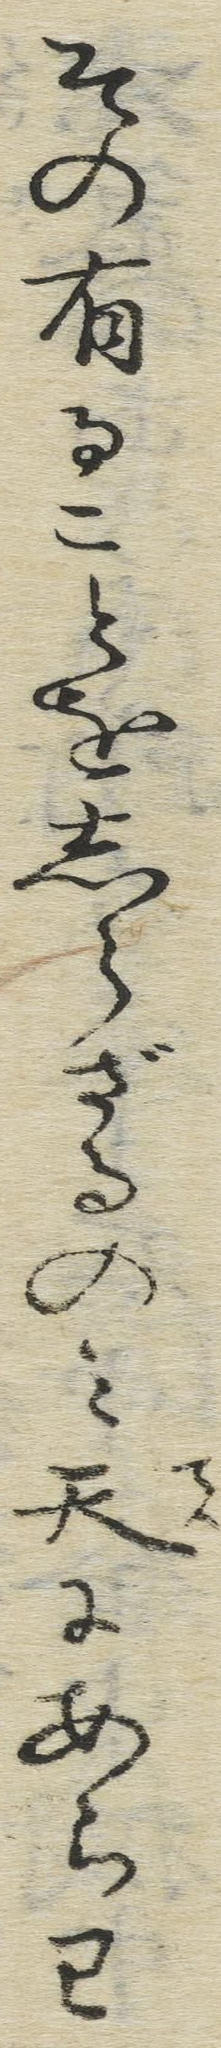その有ることをしらざるのみ天にあらわ
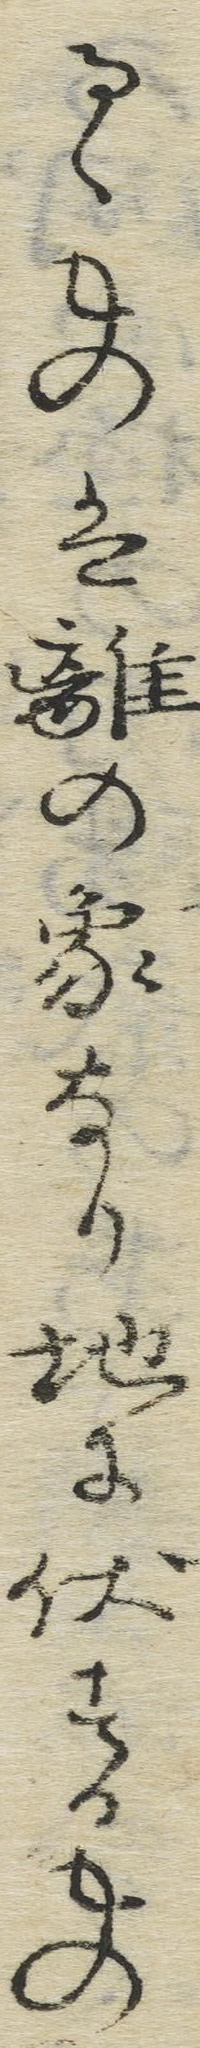るゝものは離の象なり地に伏するもの
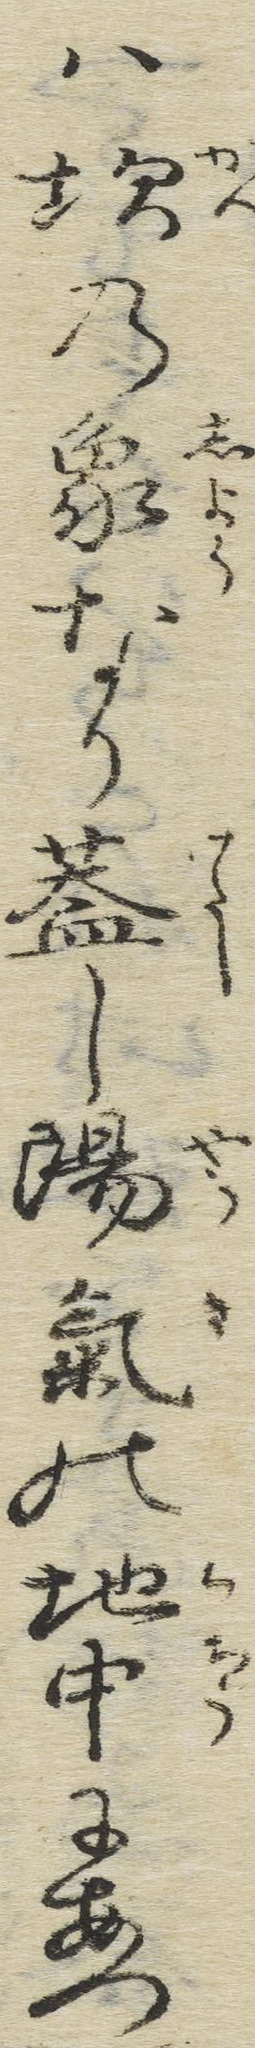は坎の象なり蓋し陽気の地中にあつ
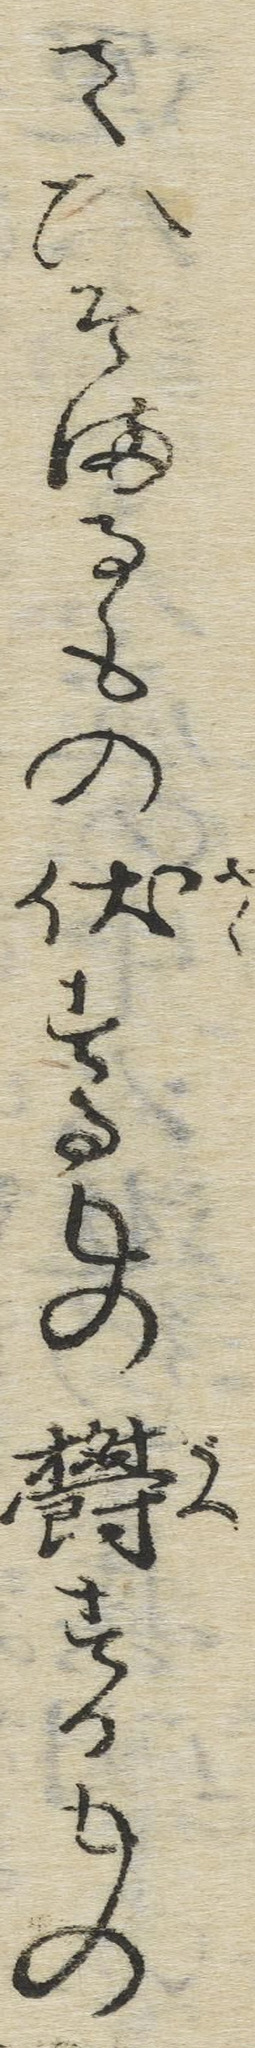てひそまるもの伏するもの欝するもの
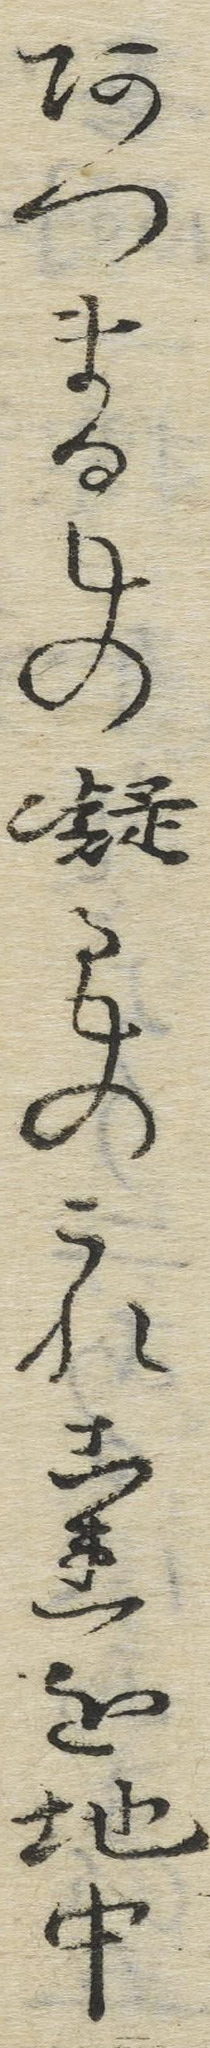あつまるもの凝るものこれこれを地中
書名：温泉考
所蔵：東京大学地震研究所図書室 Earthquake Research Institute Library, The University of Tokyo, JAPAN
